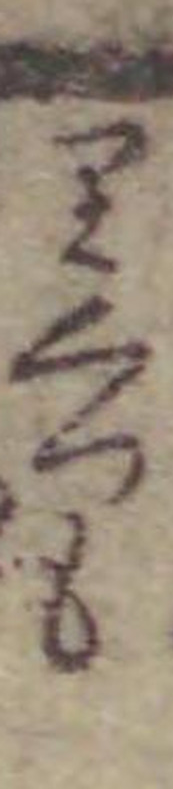りくつも
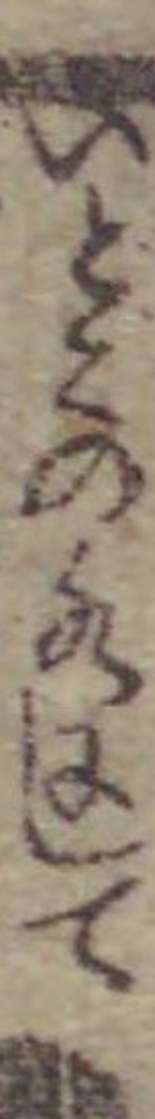いとこの水にして
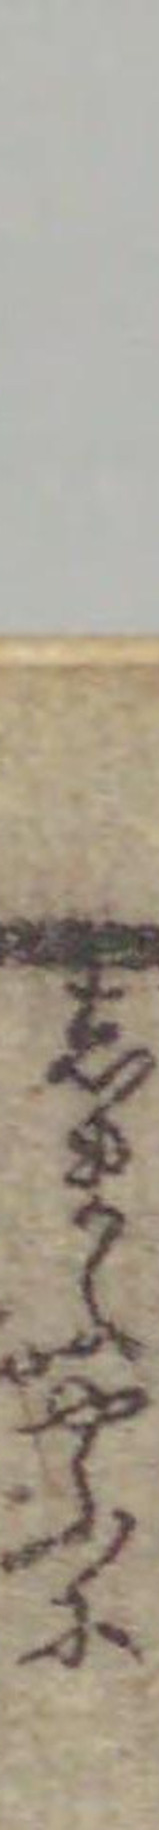しましやふに
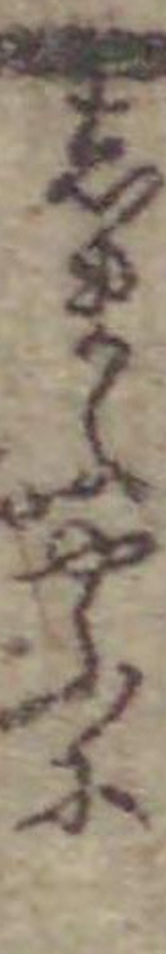しましやふに
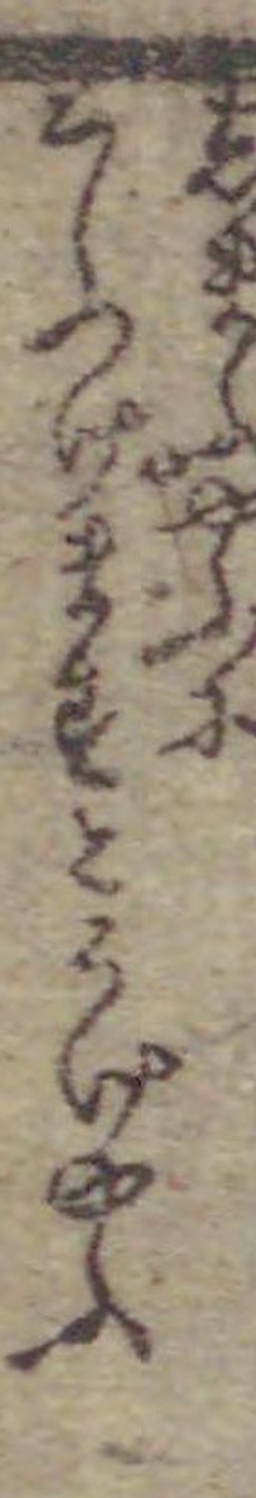こしつけますとうけやふ

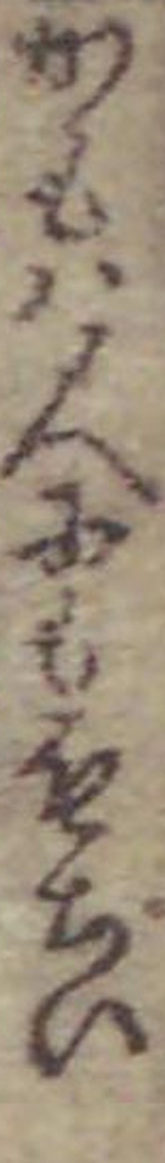かもハ人にももちい
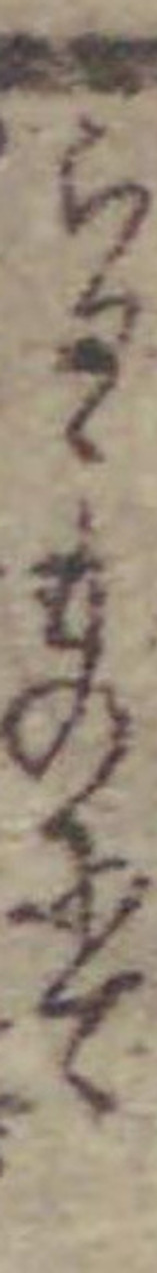らるゝものにて
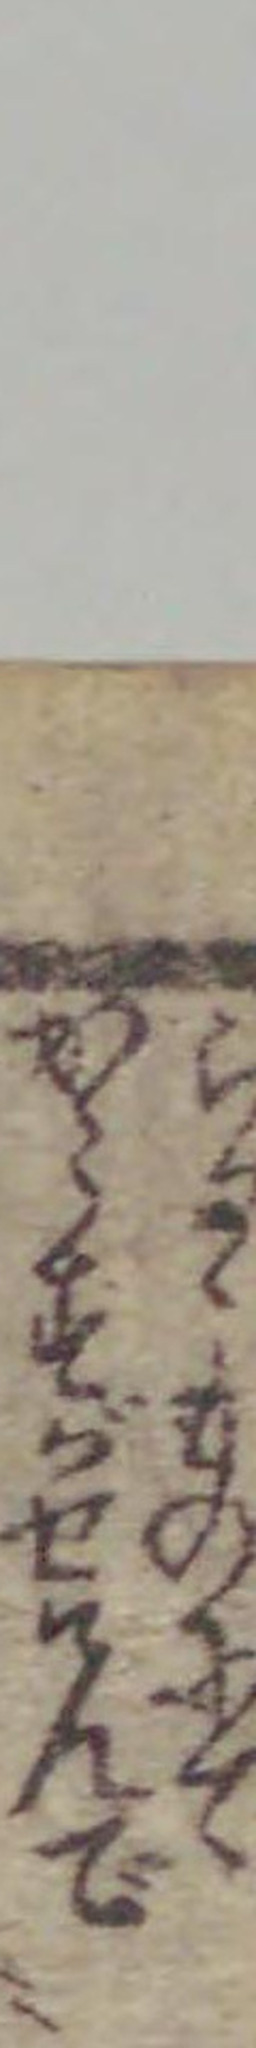からすがせけんで
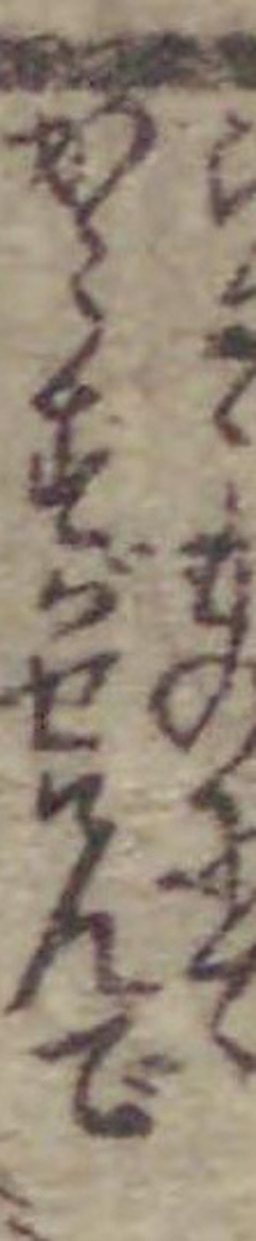からすがせけんで
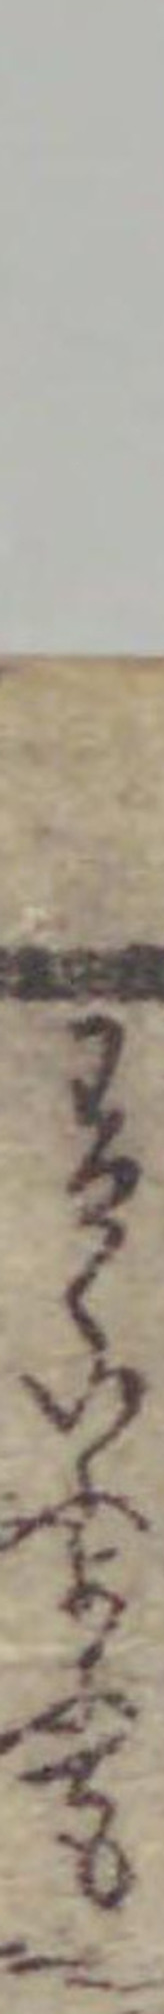わるくいふよふても
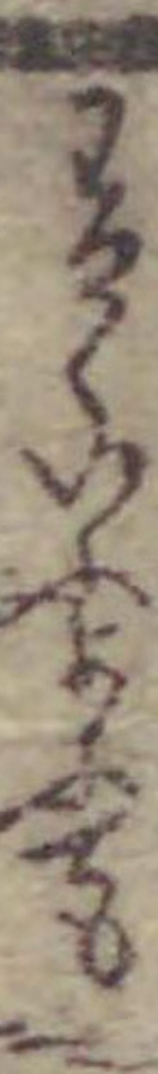わるくいふよふても
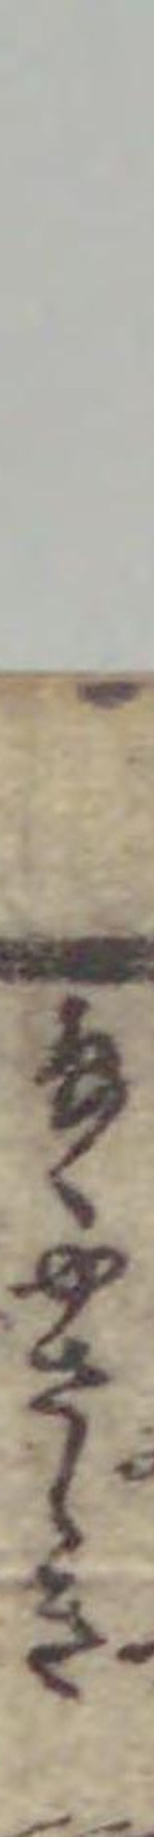なくやさしき
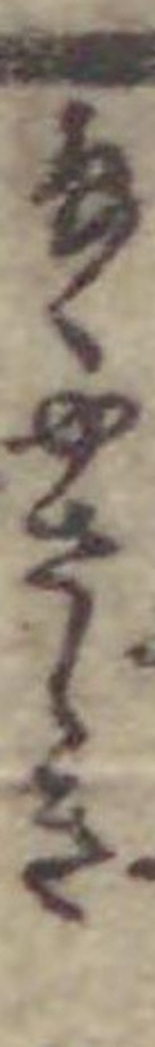なくやさしき
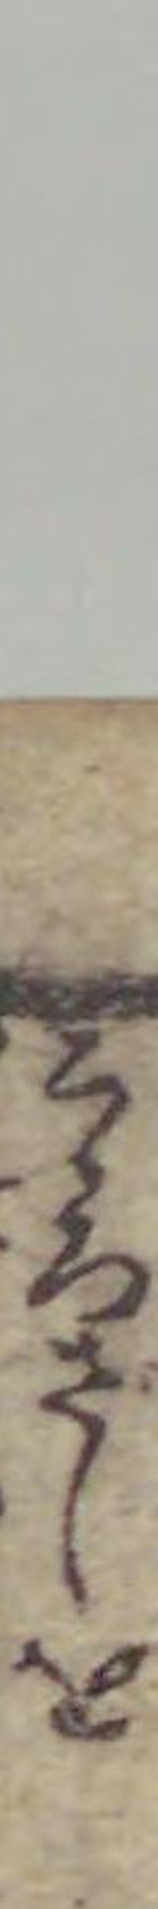こゝろざしを
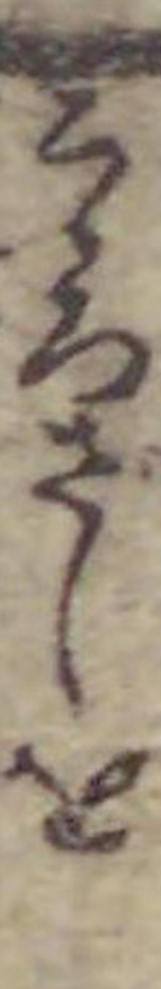こゝろざしを
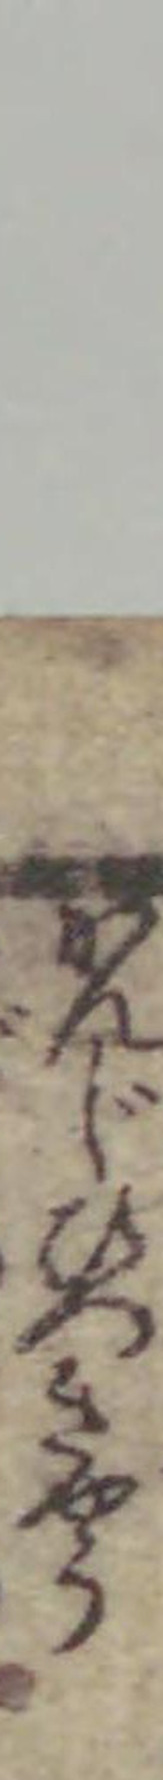かんじひつきやう
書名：烏行水諺草 3巻
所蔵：国立国会図書館 National Diet Library, JAPAN
